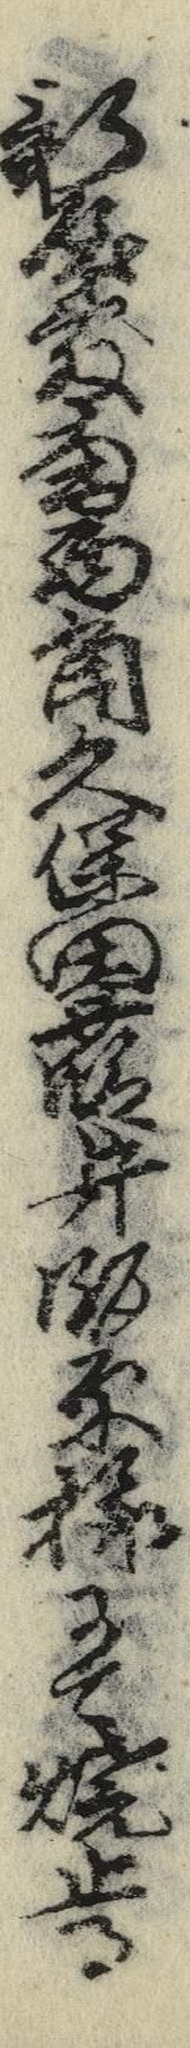新屋敷南西角久保田藤井河原様にて焼止る
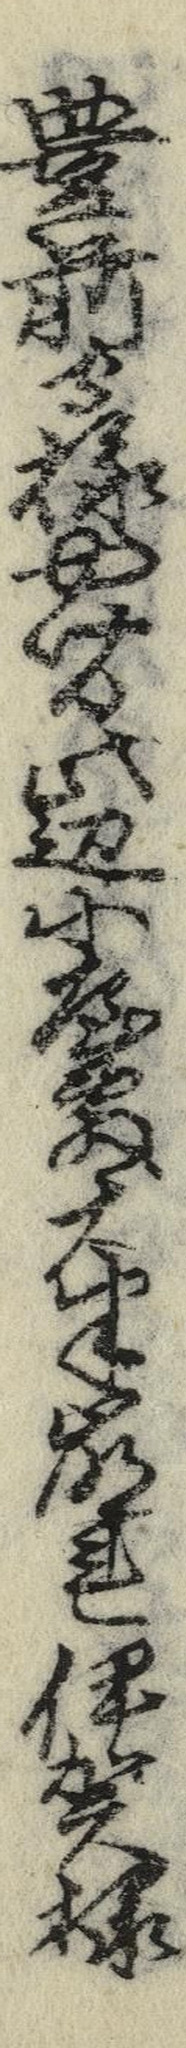豊前守様やける此辺小屋敷大半崩れ伊賀様
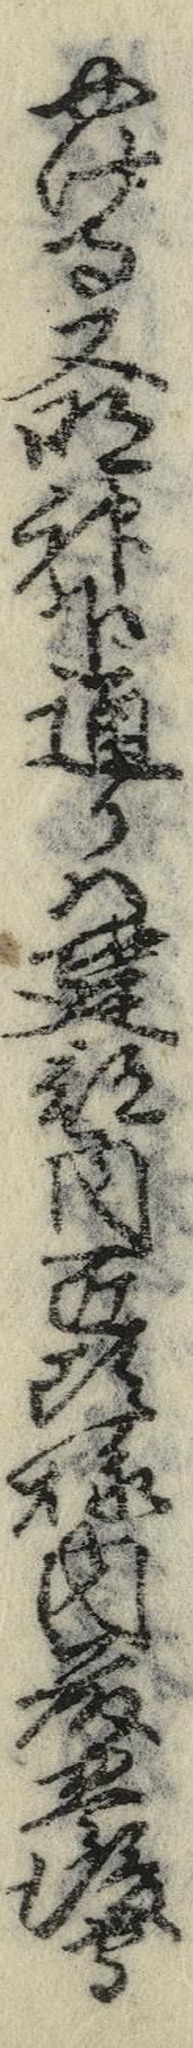やける又明神下通りは建部内匠頭様内藤豊後守
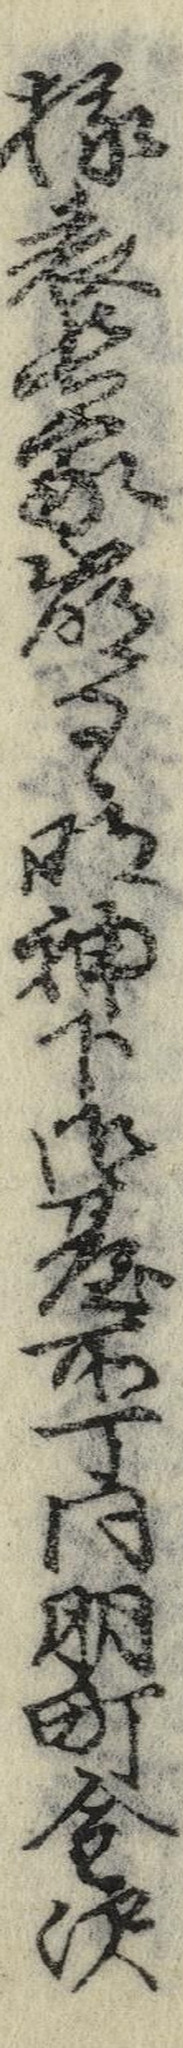様表長屋崩るゝ明神下御台所丁同朋町金沢
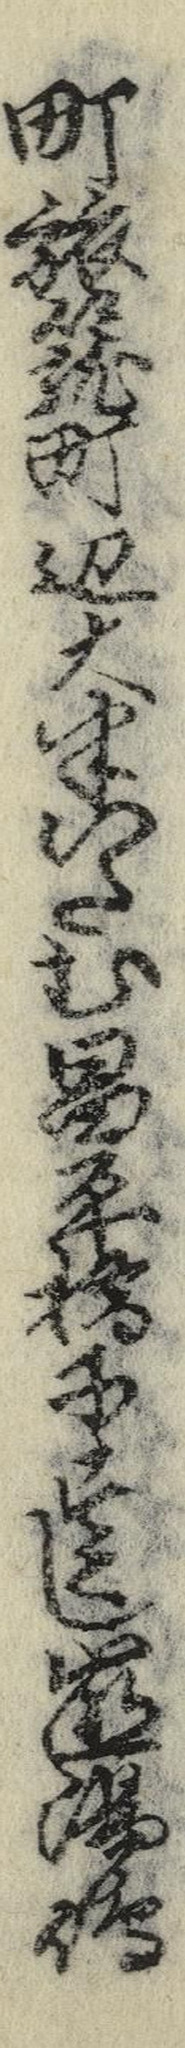町旅籠町辺大半いたむ昌平橋等すこし崩湯嶋
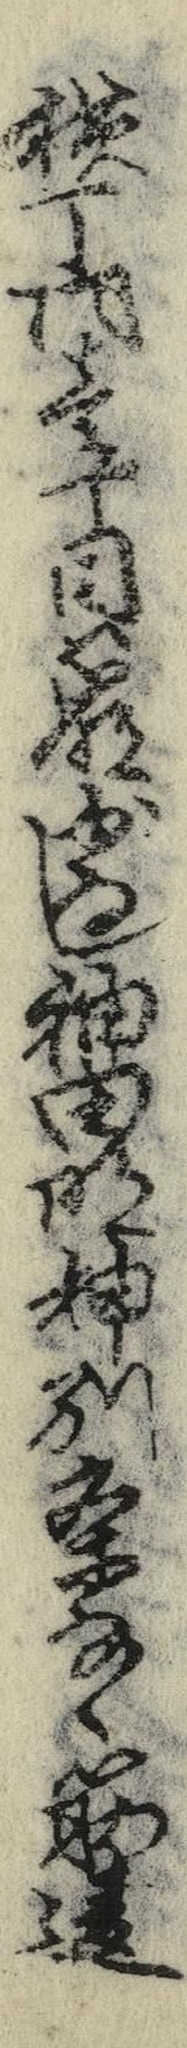横丁同壱丁目は崩少なし神田明神別条なく筋違
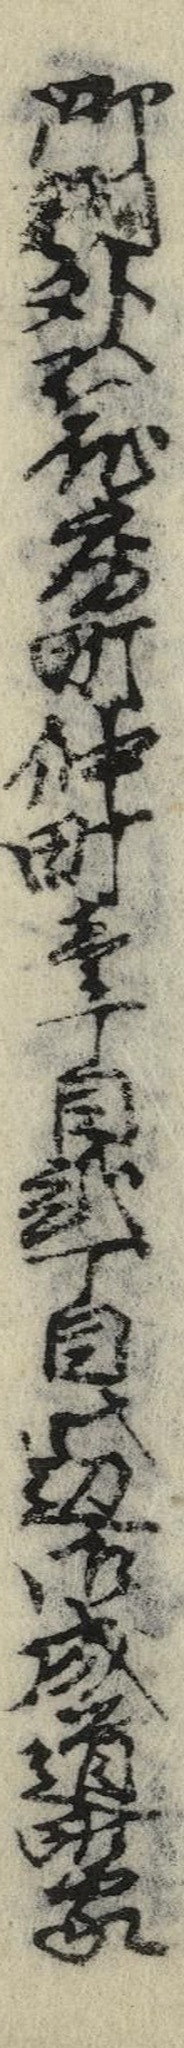御門外ハ花房町仲町壱丁目弐丁目此辺御成道町家
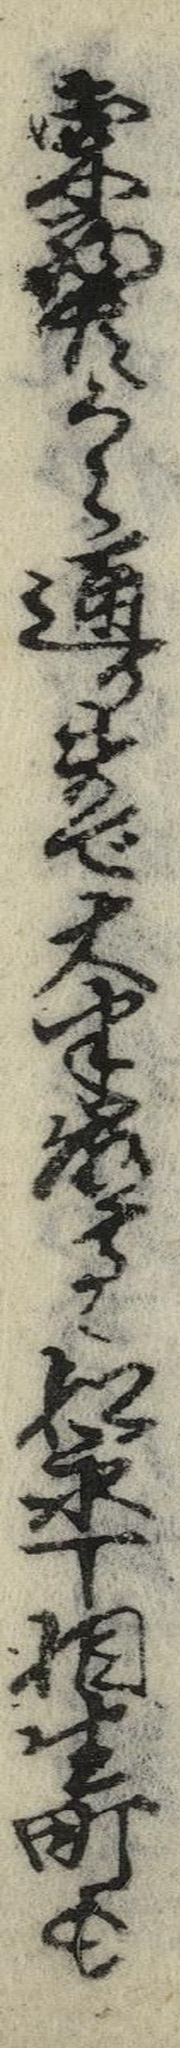東西共うら通りまで大半崩るる松永丁相生町も

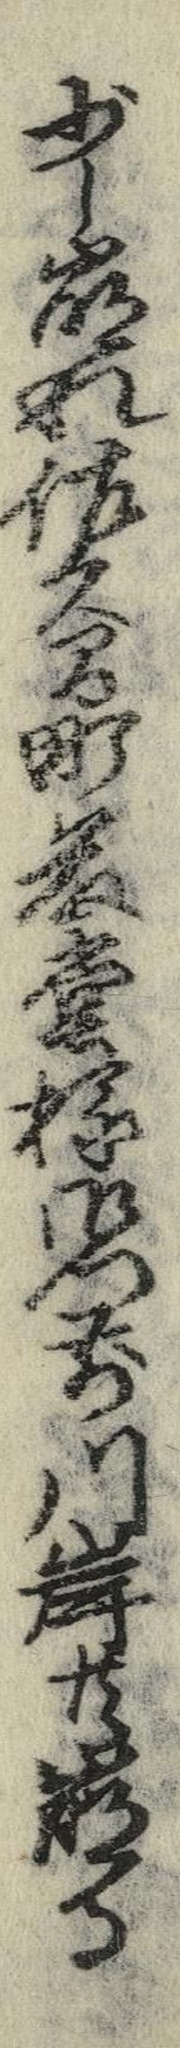少し崩れ佐久間町藤堂様御門前川岸共崩る
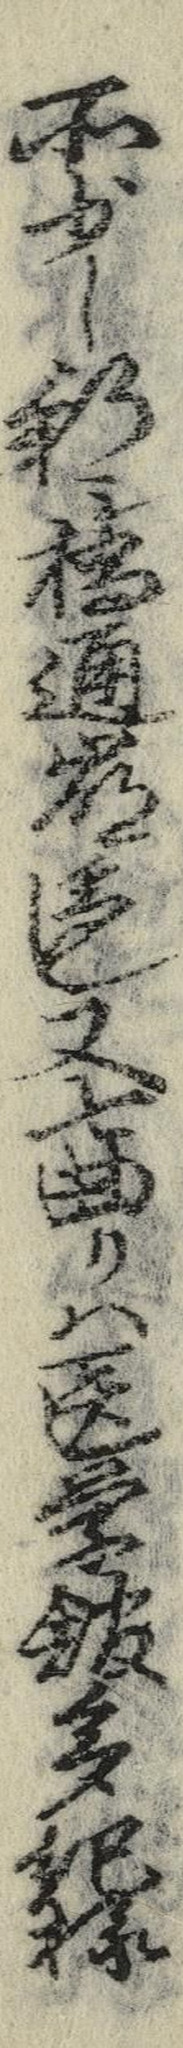所少し新橋通崩多し又七曲りは医学館多紀様
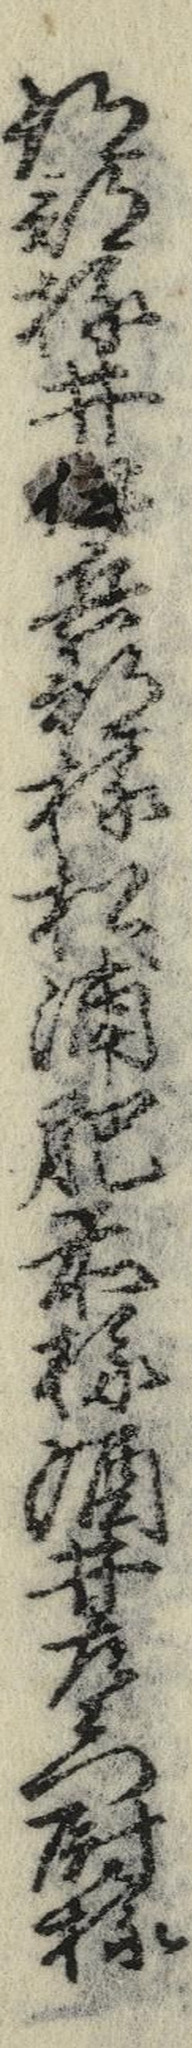形部様井伊兵部様松浦肥前様酒井左衛門尉様
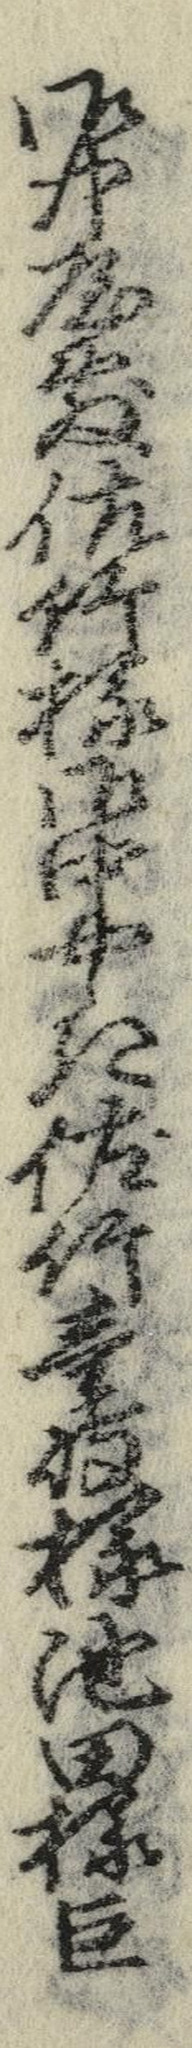御中屋敷佐竹様御中やしき佐竹壱岐様池田様巨
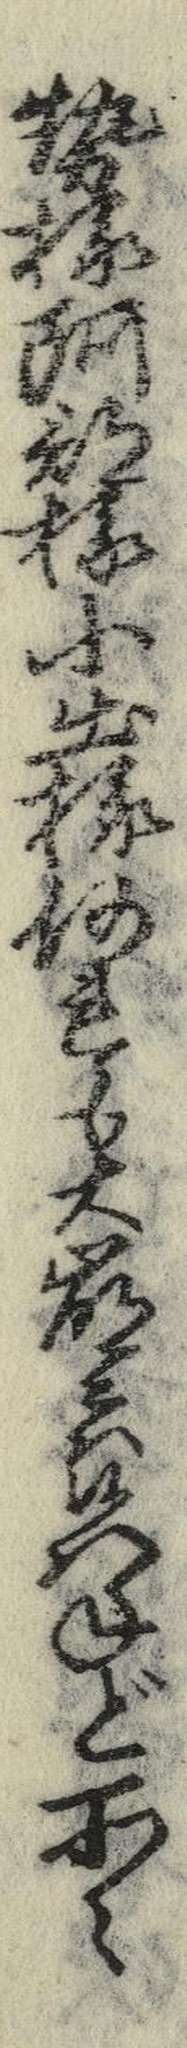㔟様阿部様小出様何れも大崩には候はねど所々
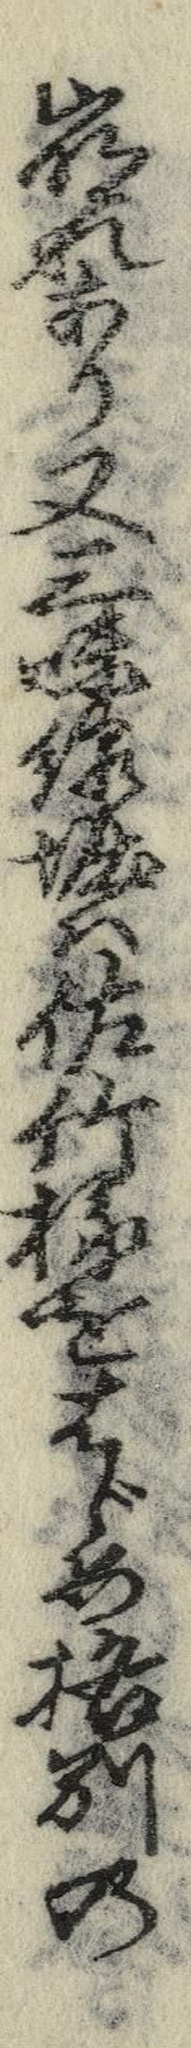崩れあり又三味線堀は佐竹様をはじめ格別の
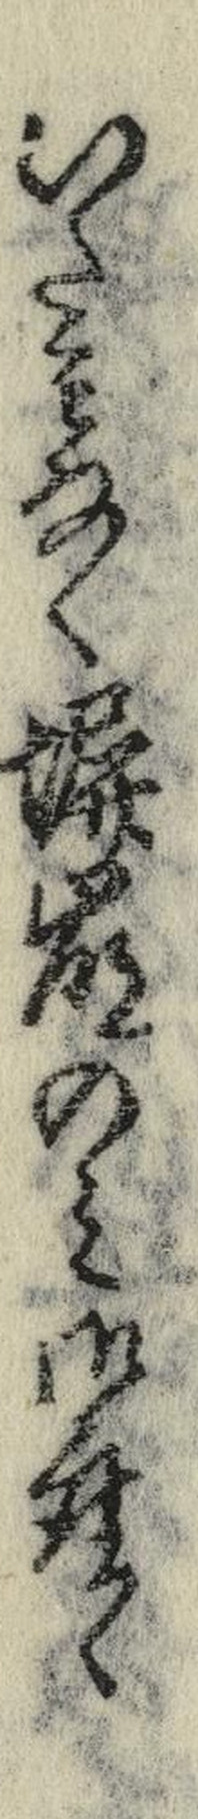いたみなく塀崩れのみ御座候
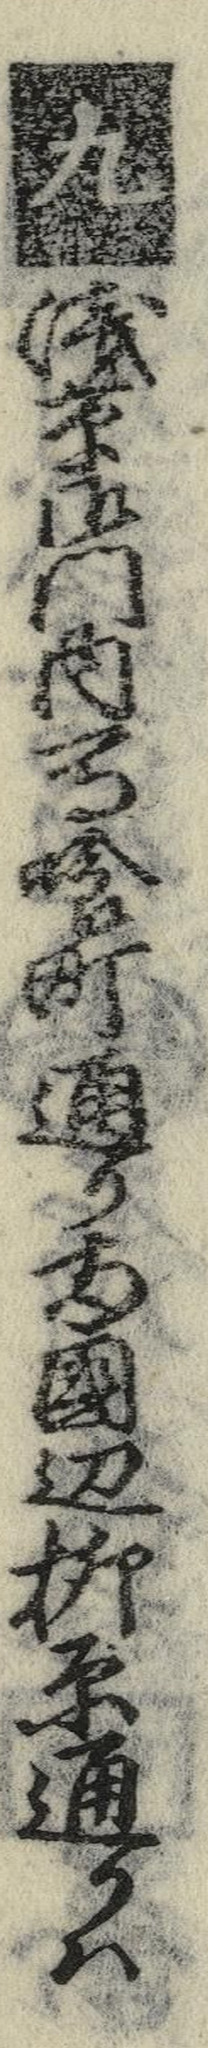九浅草御門内馬喰町通り両國辺柳原通りは
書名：地震類焼場所明細書之写　安政二卯年十月二日夜四ツ時過　御府内御屋敷方市中共、并街道筋近郷聞書
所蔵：東京大学地震研究所図書室 Earthquake Research Institute Library, The University of Tokyo, JAPAN
